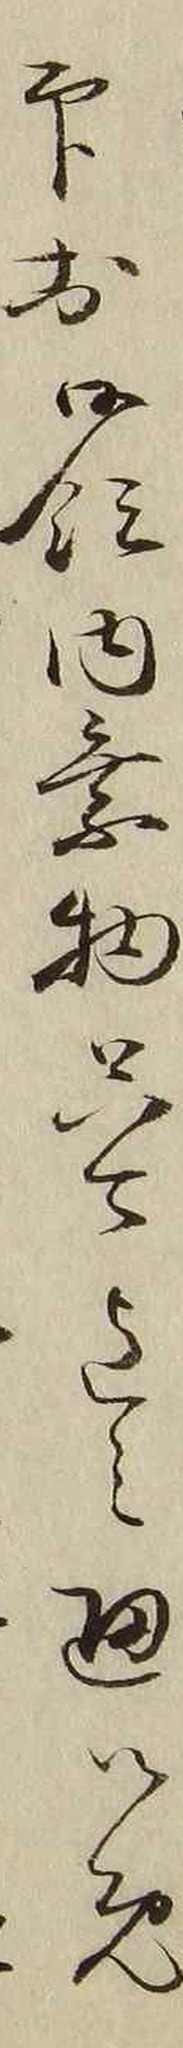印於御領内乗物只今迄之通御免
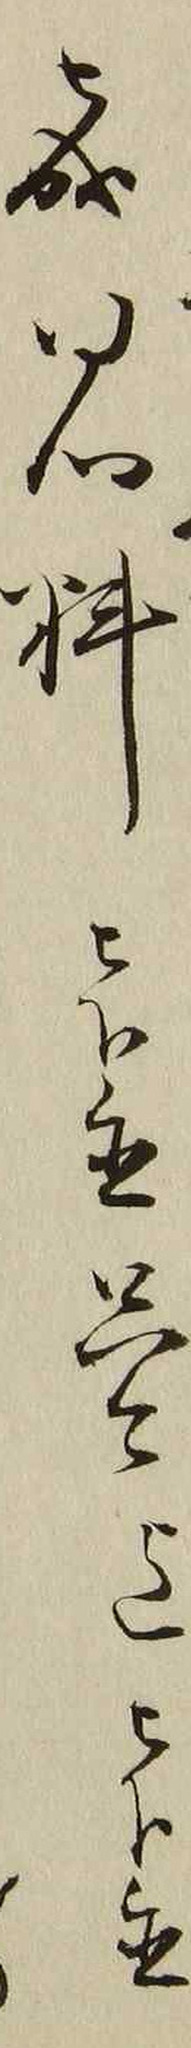被成同心料被下置只今迄被下置
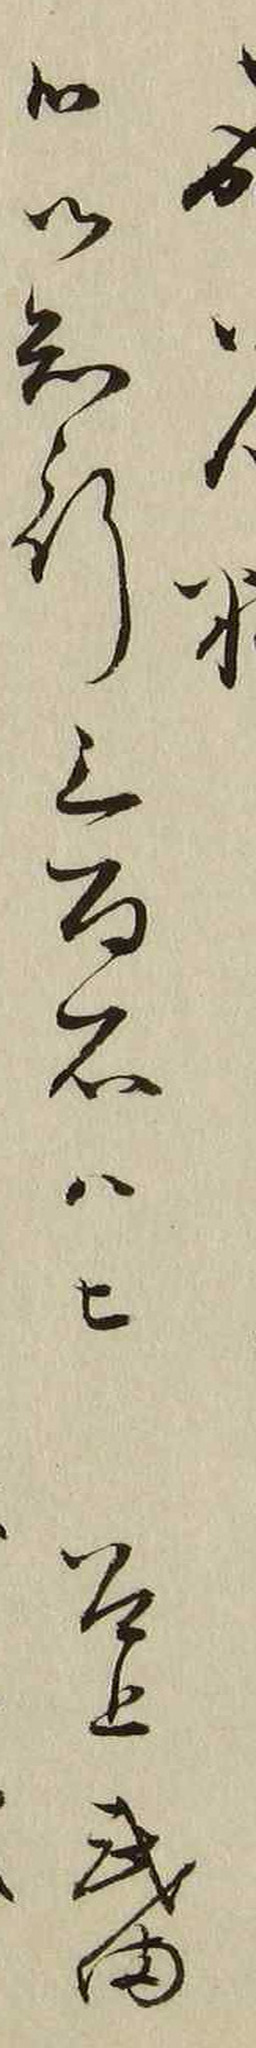候御知行三百石は被召上武備
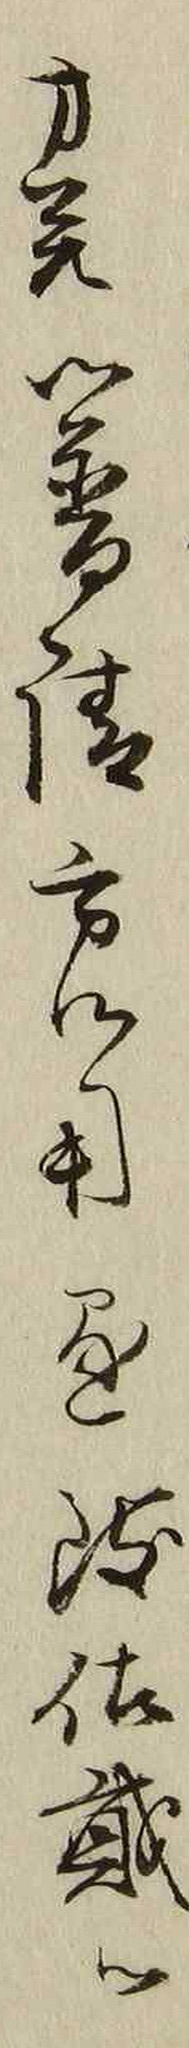方并御普請方御用懸致佐戴候
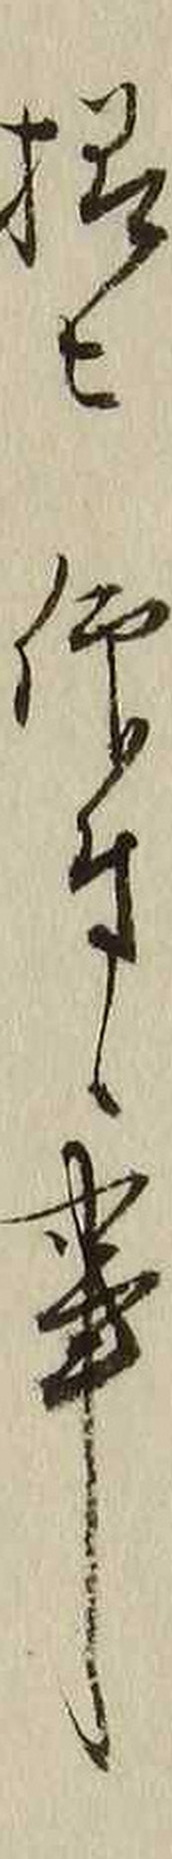様被仰付候事
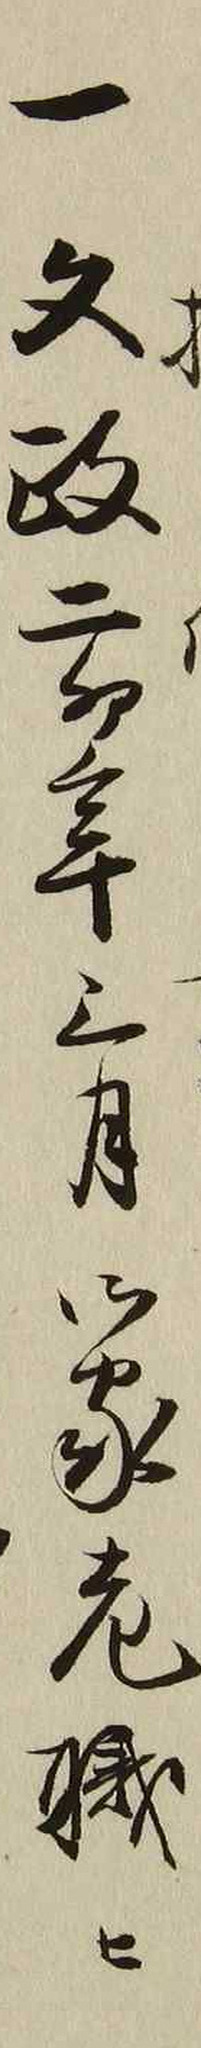一文政二卯年三月御家老職被
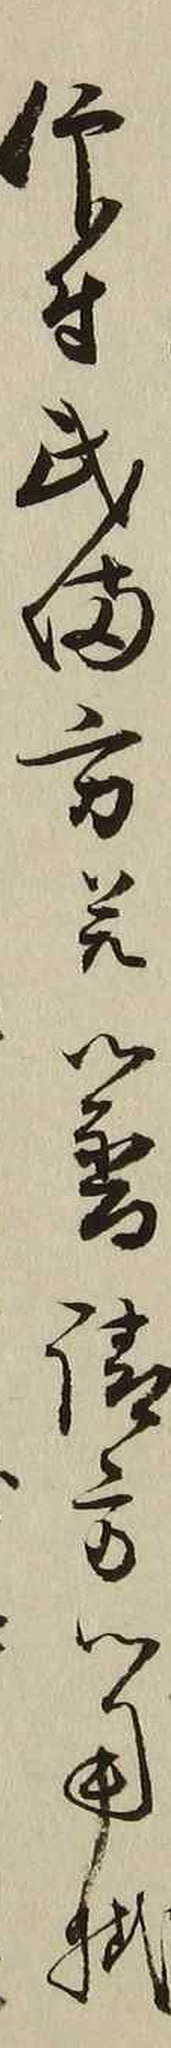仰付武備方并御普請方御用掛
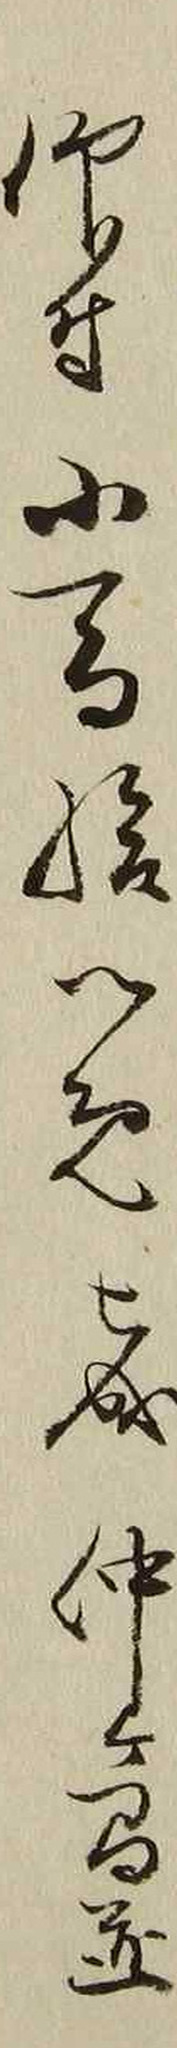被仰付小馬給御免被成仲け間並
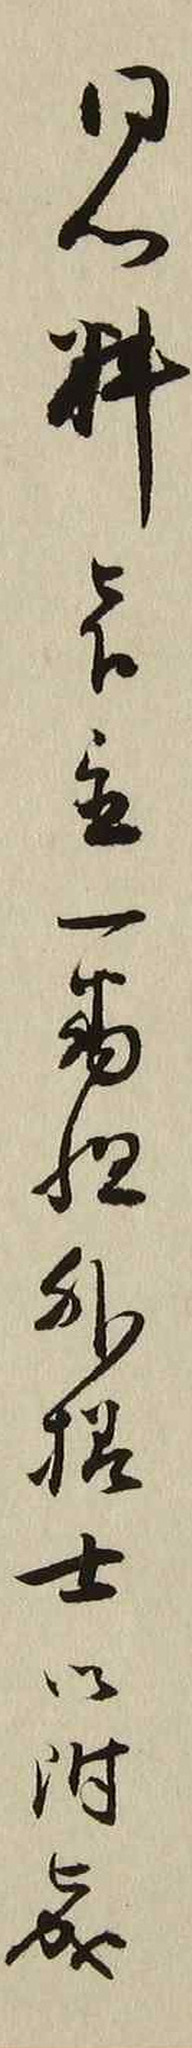同心料被下置一番組外様士御附被成
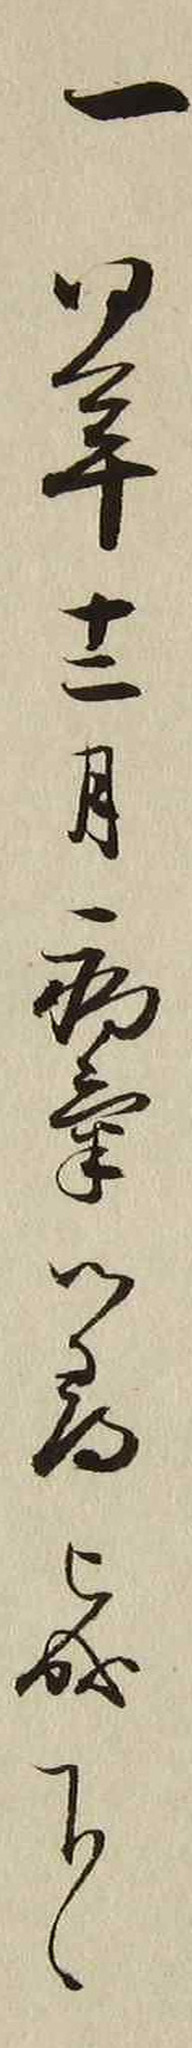一同年十二月病気御尋被成下候
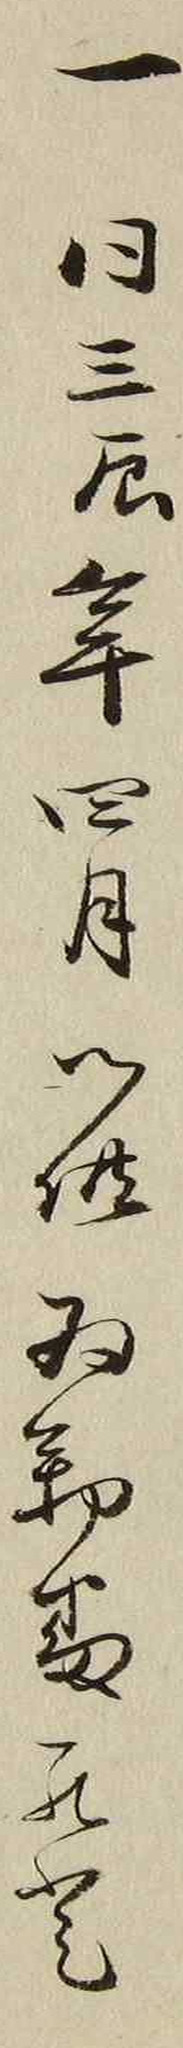一同三辰年四月御供為勤番罷登
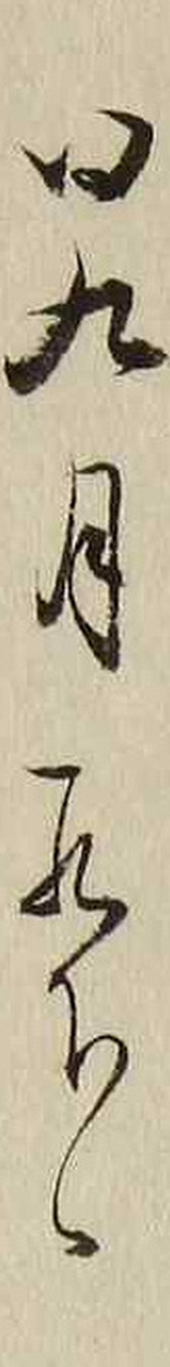同九月罷下候
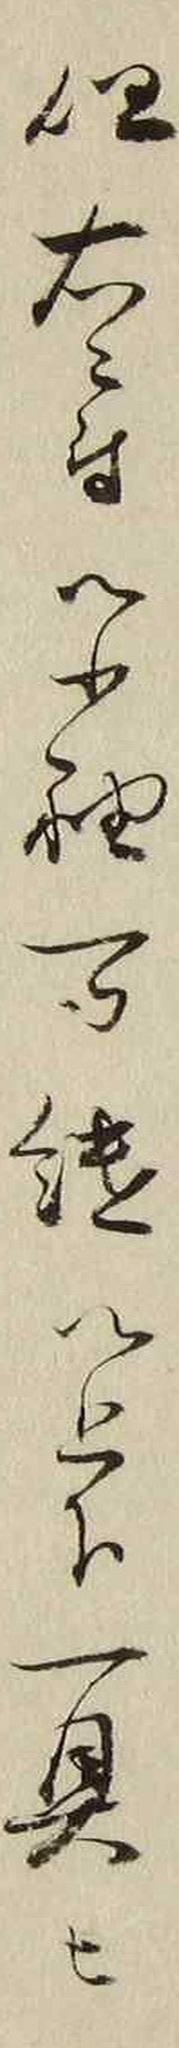但右に付御小袖一つ継御上下一具被
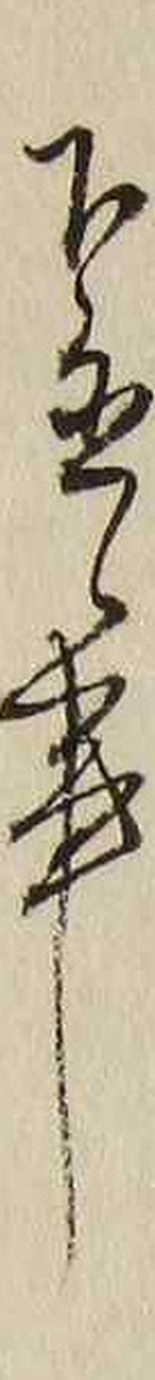下置候事
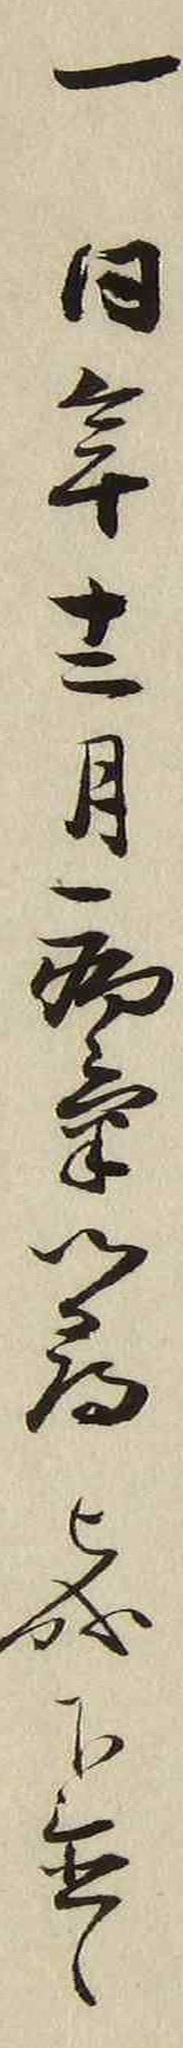一同年十二月病気御尋被成下置候

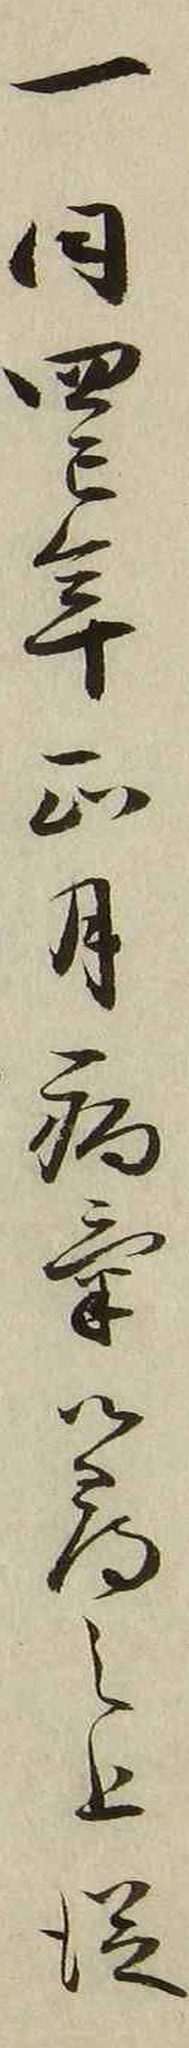一同四巳年正月病気御尋之上従
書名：諸士系譜　巻之292　き之部1
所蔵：会津若松市立会津図書館
